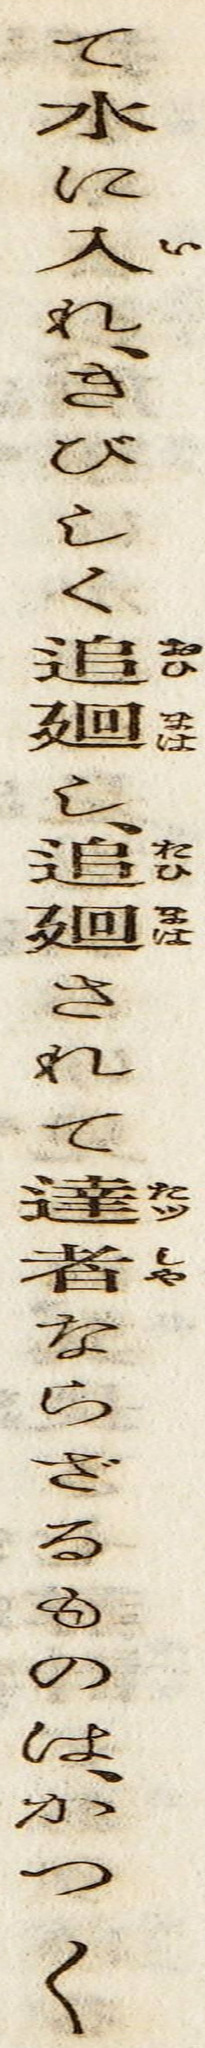て水に入れ、きびしく追廻し、追廻されて達者ならざるものは、かつ〳〵
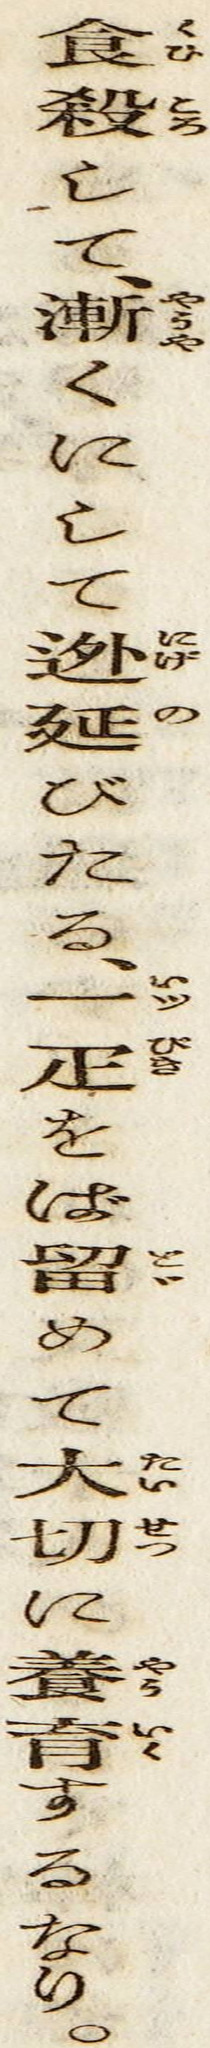食殺して、漸くにして逃延びたる、一疋をば留めて大切に養育するなり。
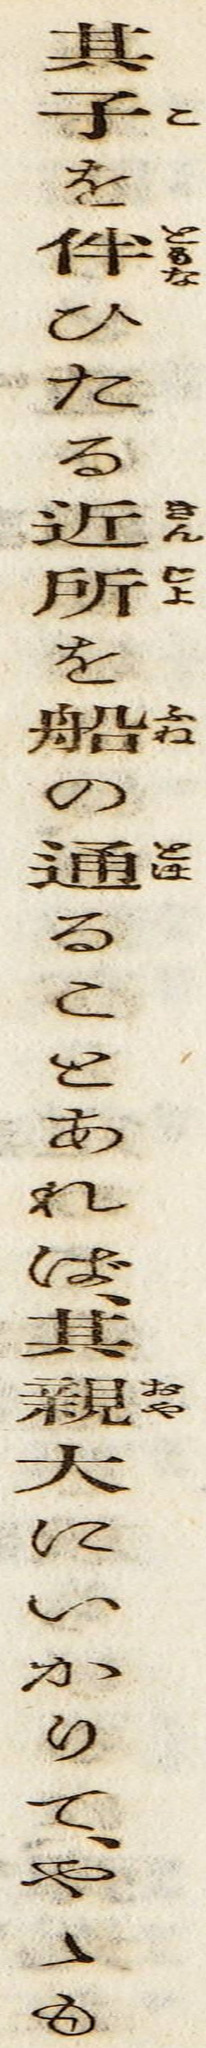其子を伴ひたる近所を船の通ることあれば、其親大にいかりて、やゝも
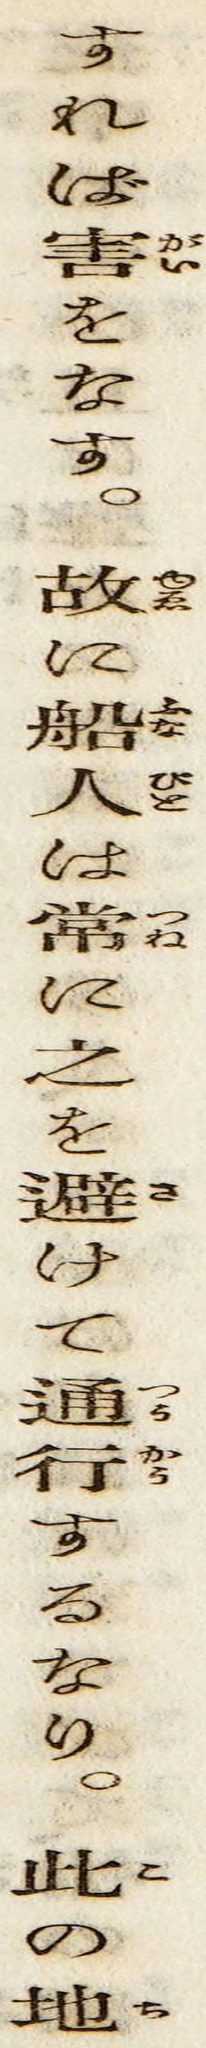すれば害をなす。故に船人は常に之を避けて通行するなり。此の地
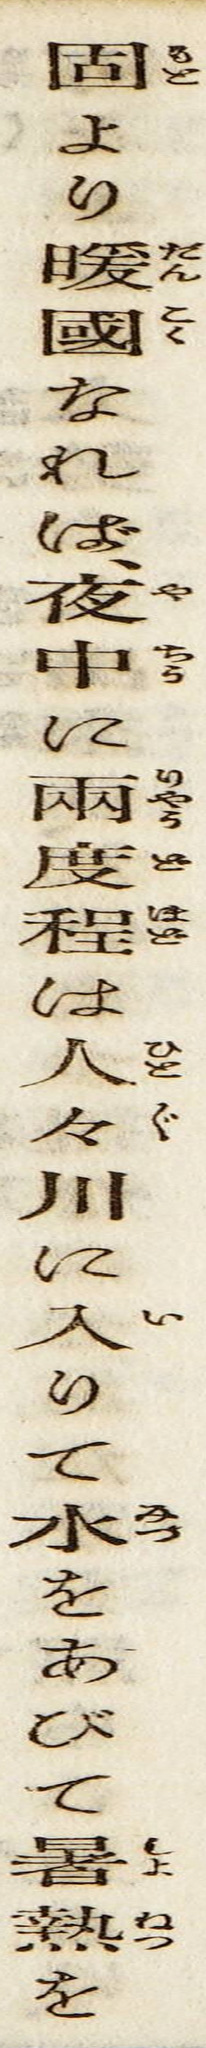固より暖国なれば、夜中に両度程は人々川に入りて水をあびて暑熱を
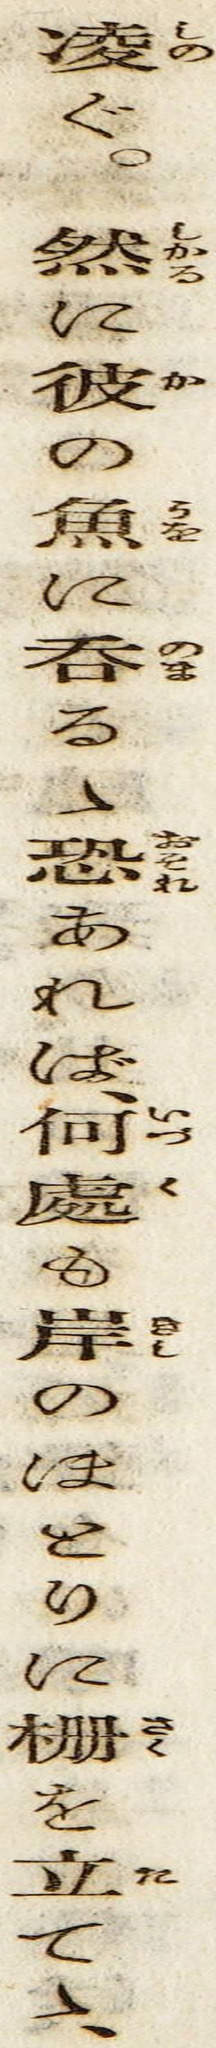凌ぐ。然に彼の魚に呑るゝ恐あれば、何処も岸のほとりに柵を立てゝ、
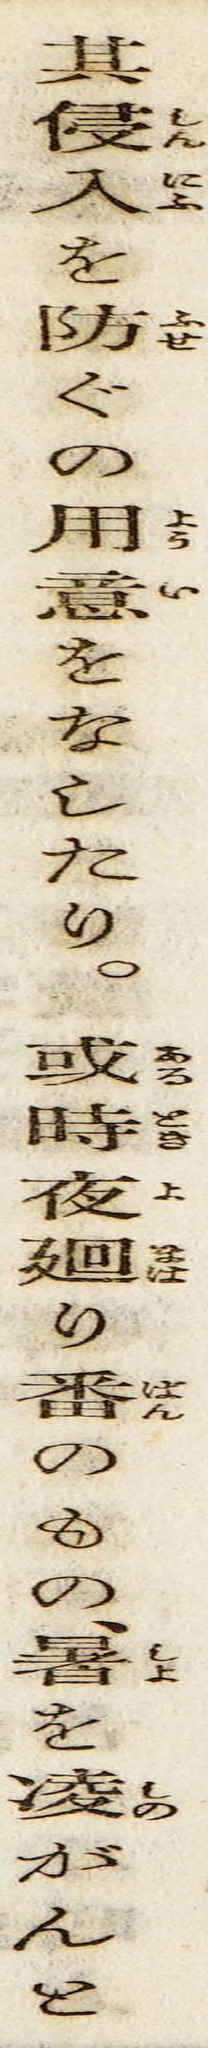其侵入を防ぐの用意をなしたり。或時夜廻り番のもの、暑を凌がんと
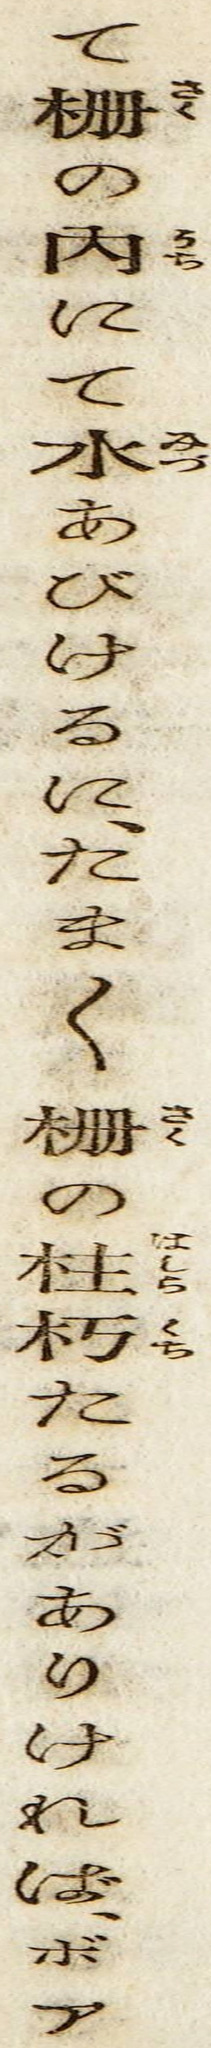て柵の内にて水あびけるに、たま〳〵柵の柱朽たるがありければ、ボア

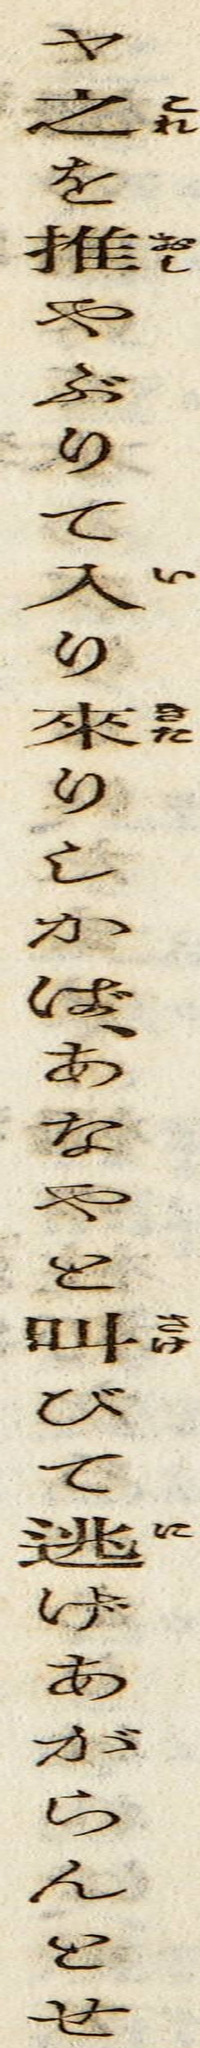ヤ之を推やぶりて入り来りしかば、あなやと叫びて逃げあがらんとせ
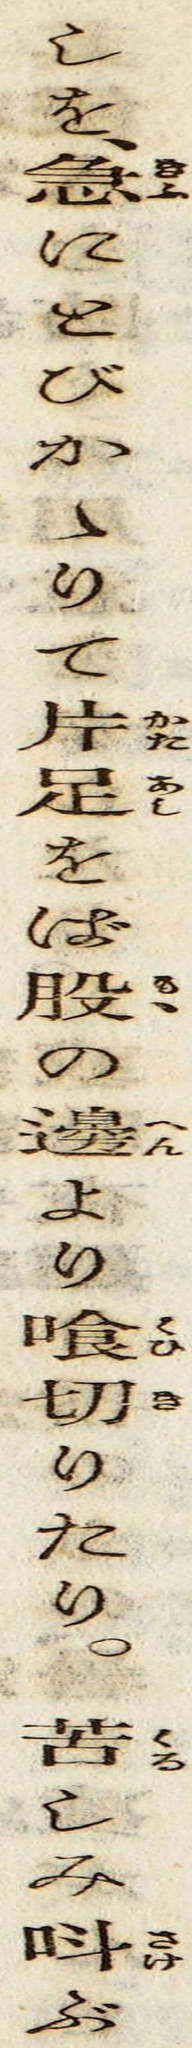しを、急にとびかゝりて片足をば股の辺より喰切りたり。苦しみ叫ぶ
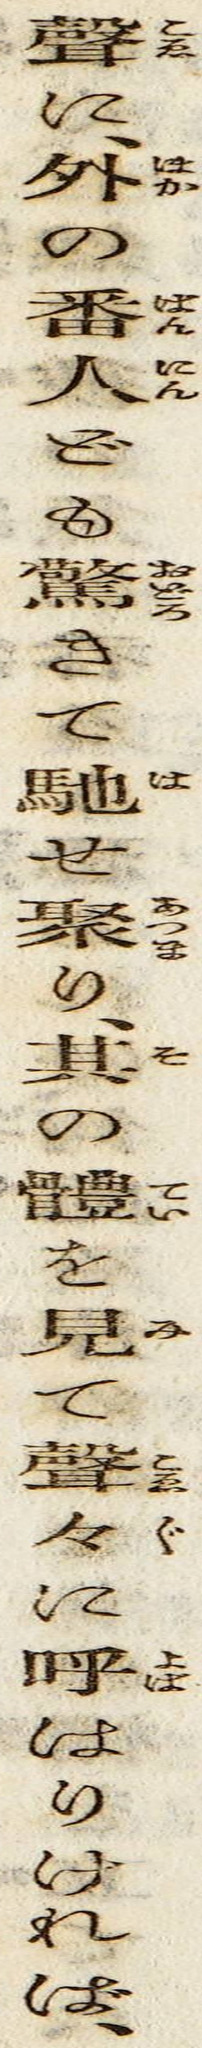声に、外の番人ども驚きて馳せ聚り、其の体を見て声々に呼はりければ、
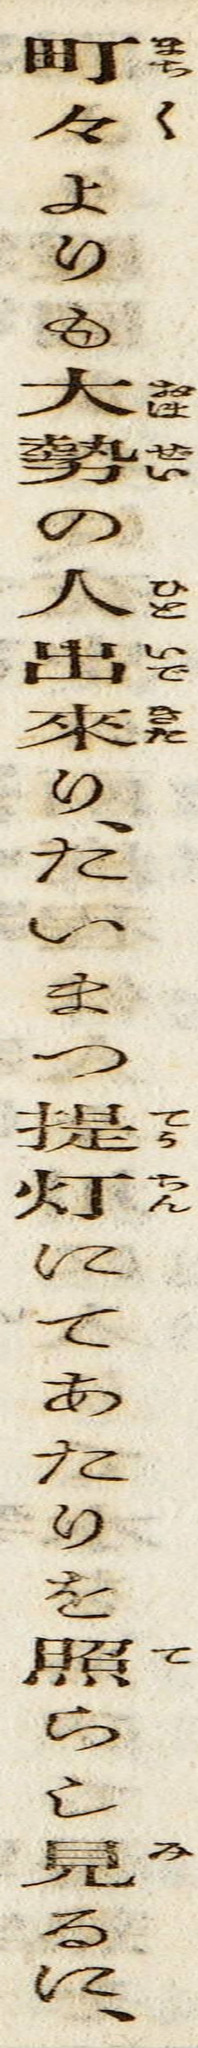町々よりも大勢の人出来り、たいまつ提灯にてあたりを照らし見るに、
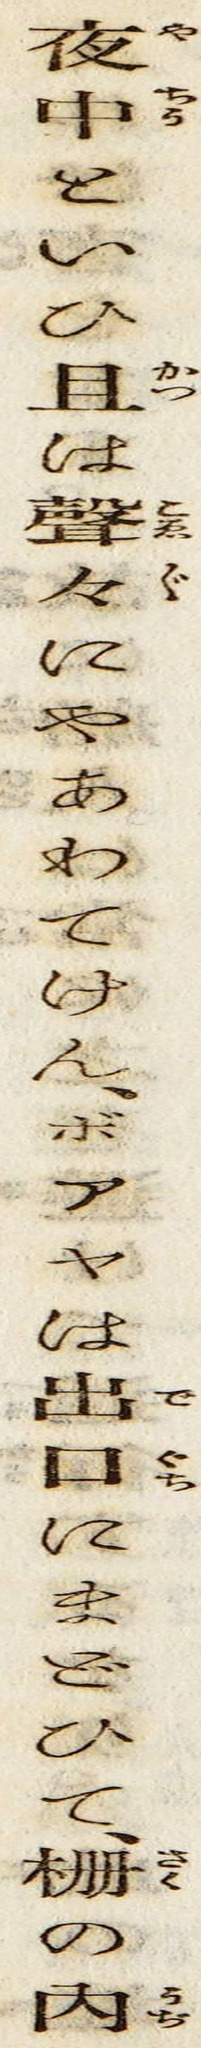夜中といひ且は声々にやあわてけん、ボアヤは出口にまどひて、柵の内
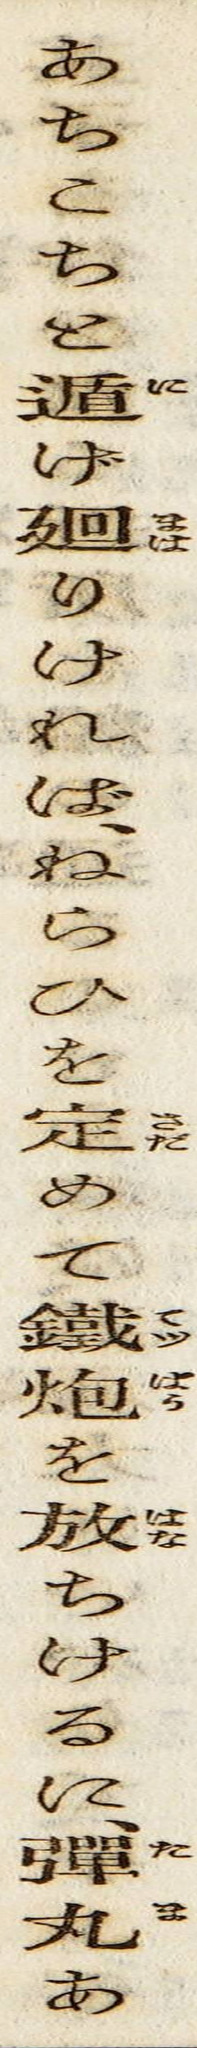あちこちと遁げ廻りければ、ねらひを定めて鉄炮を放ちけるに、弾丸あ
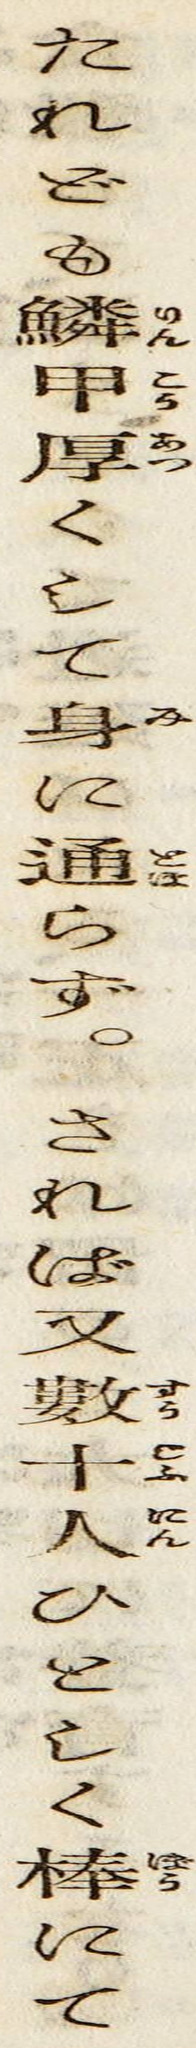たれども鱗甲厚くして身に通らず。されば又数十人ひとしく棒にて
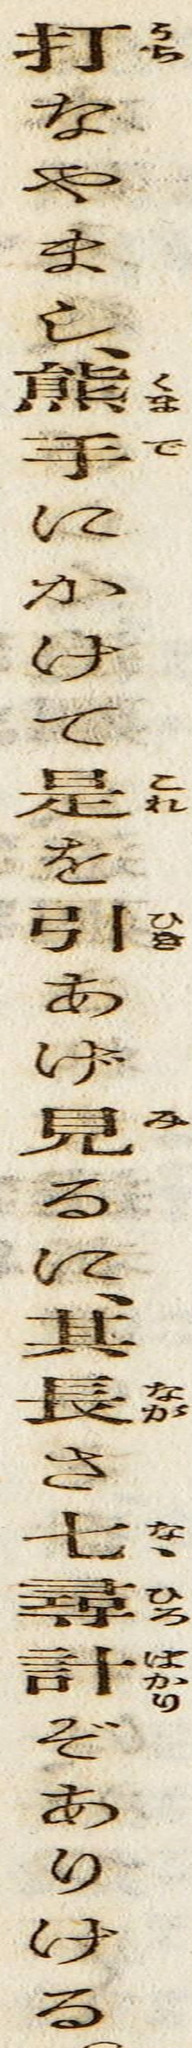打なやまし、熊手にかけて是を引あげ見るに、其長さ七尋計ぞありける。
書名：日本漂流譚
